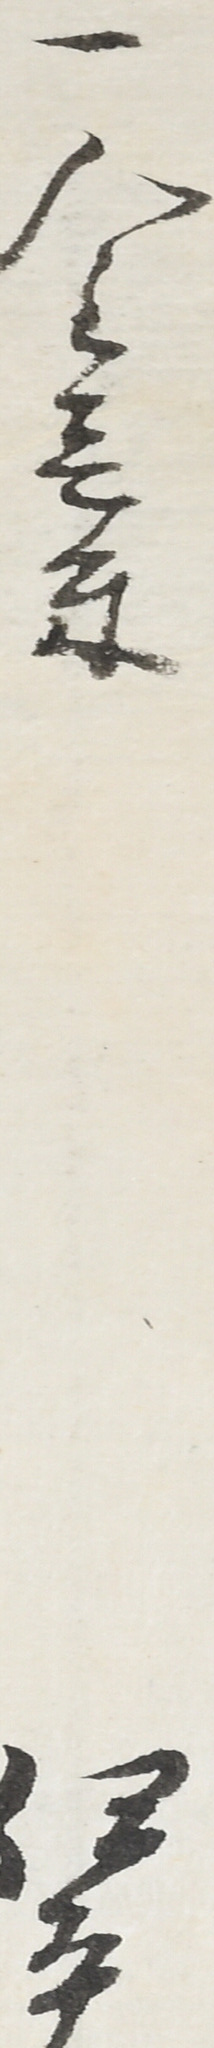一金壱朱伊平治
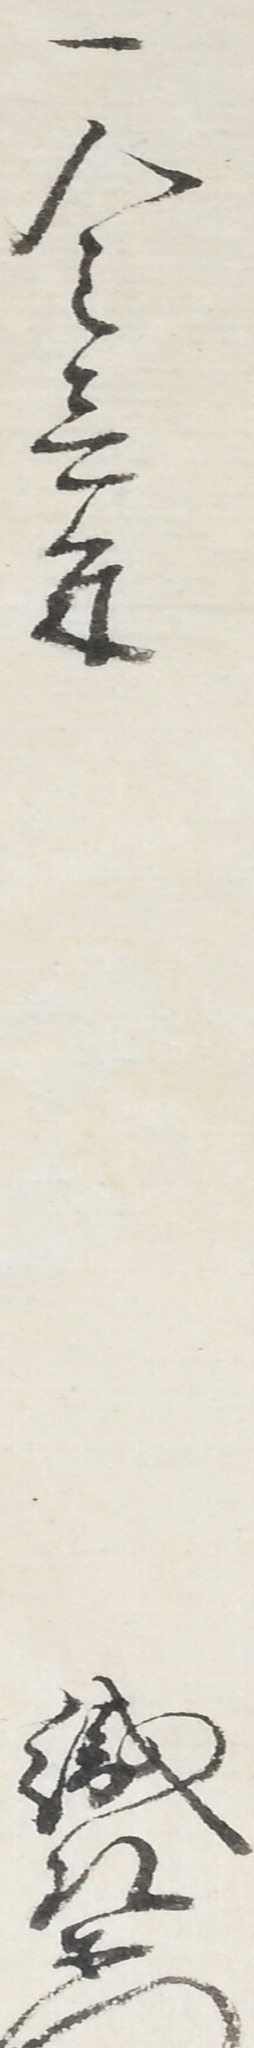一金壱朱織左衛門

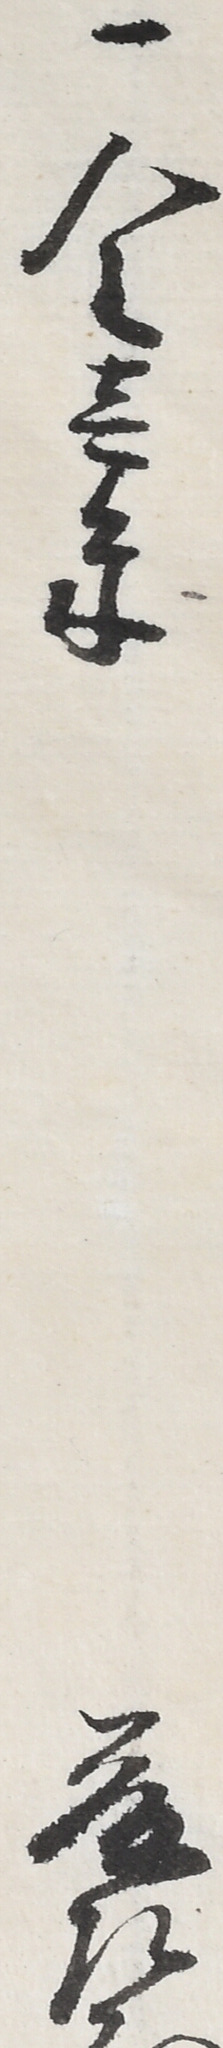一金壱朱藤左衛門
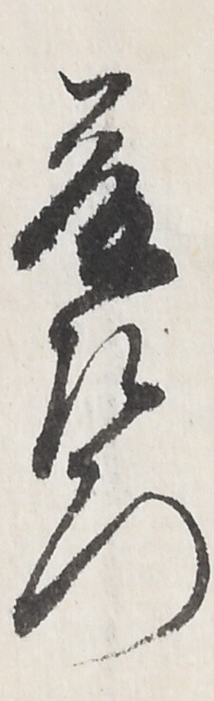増左衛門
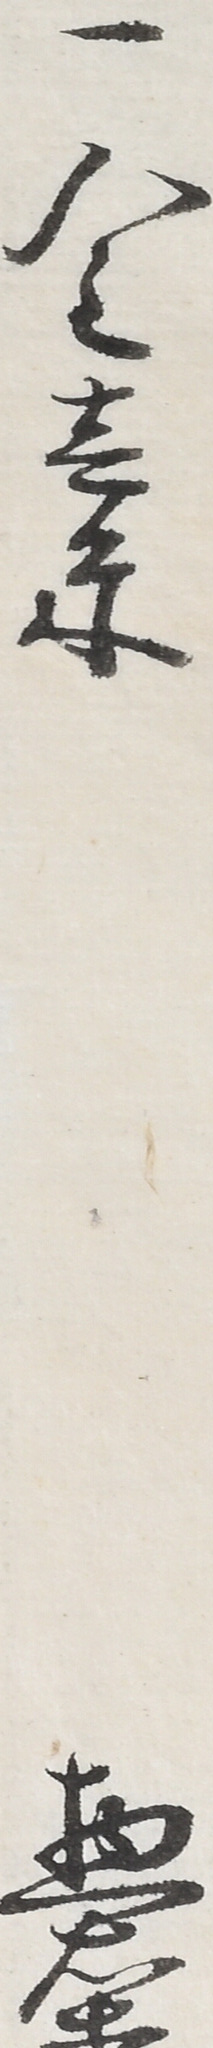一金壱朱惣右衛門
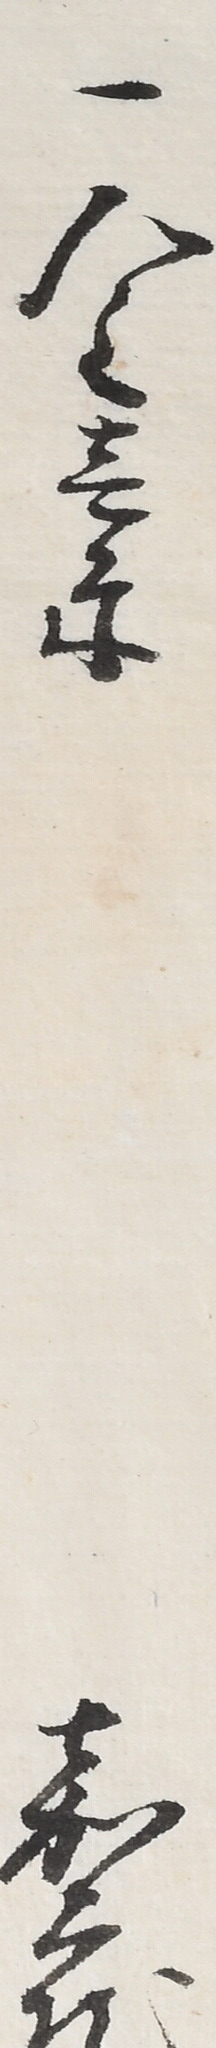一金壱朱嘉蔵
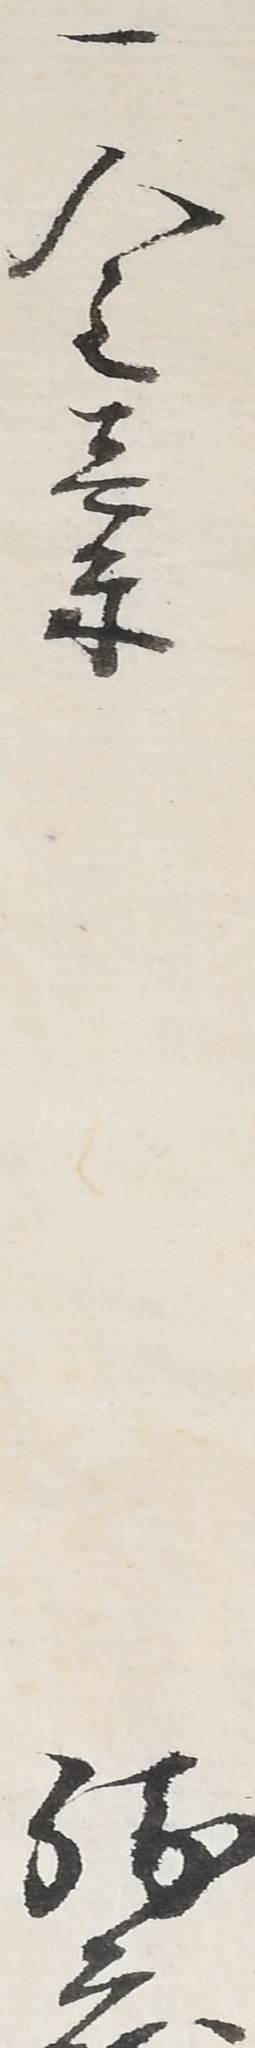一金壱朱嘉蔵
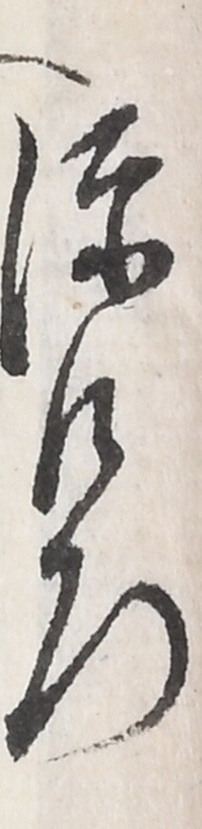増左衛門
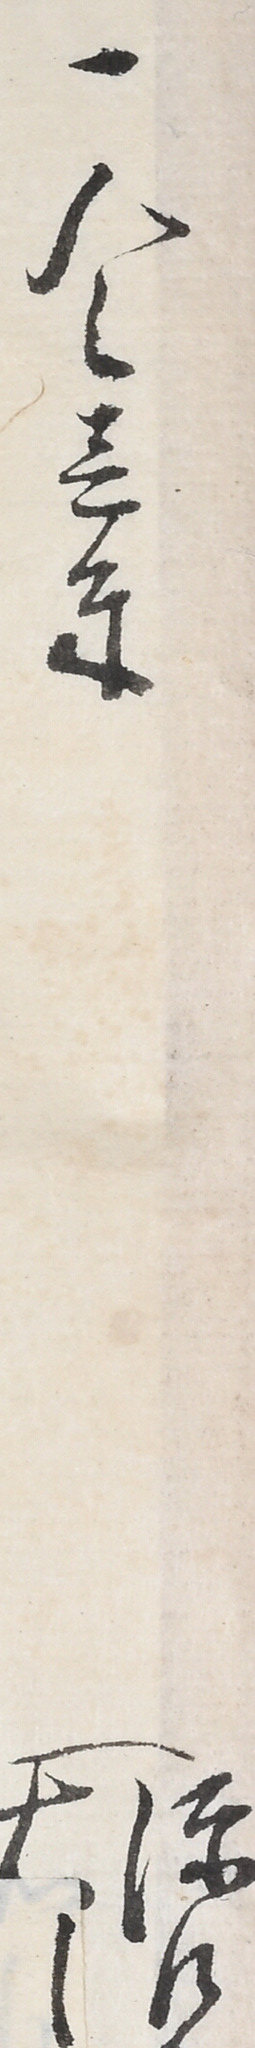一金壱朱嘉蔵
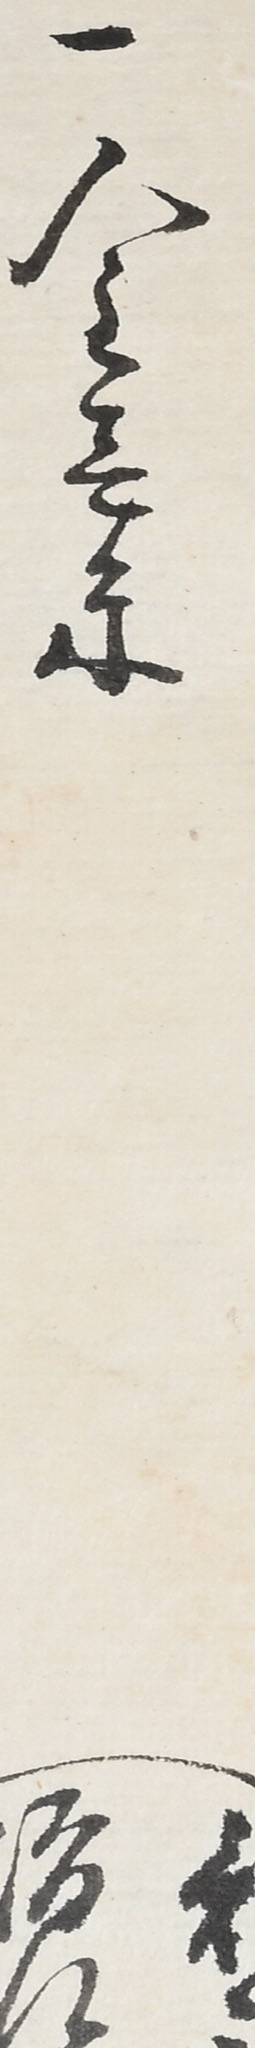一金壱朱嘉蔵
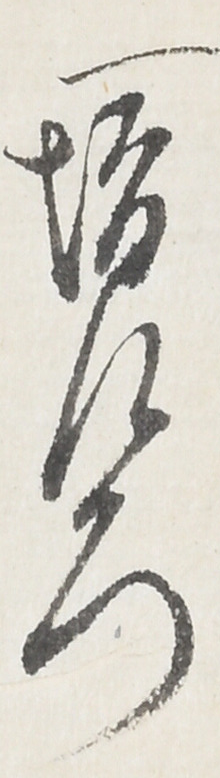増左衛門
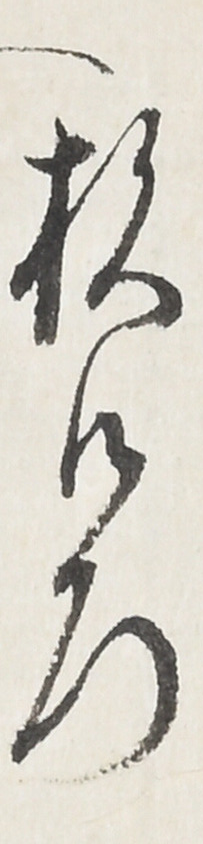増左衛門
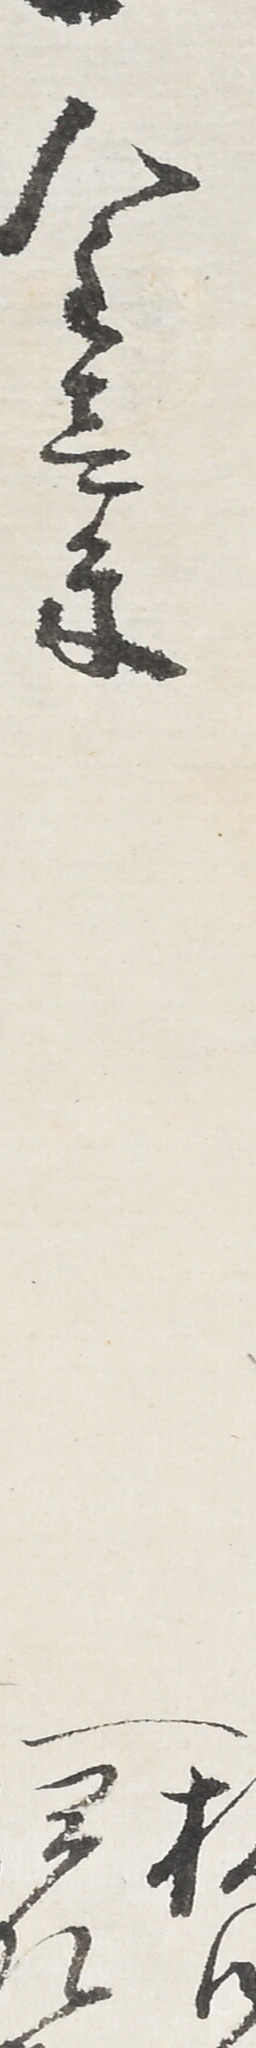一金壱朱嘉蔵
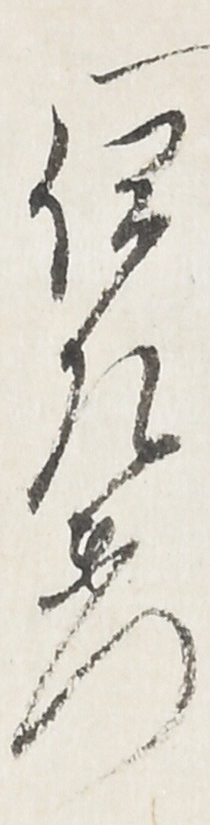伊左衛門

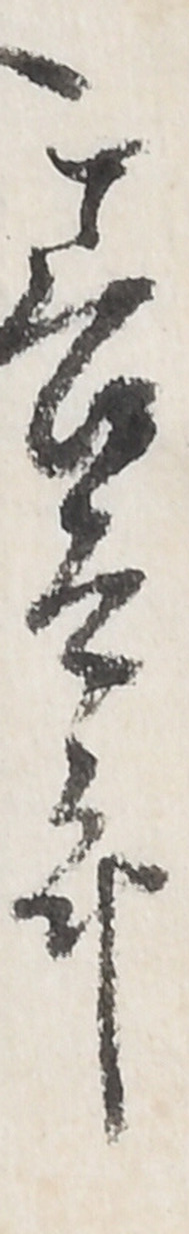善太郎
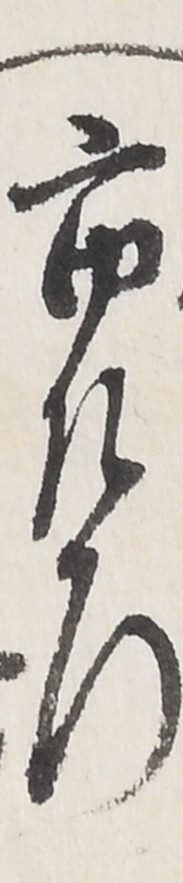甚左衛門
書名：御拝地百五拾年御祝儀献上御目録名前
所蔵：伊那市立高遠町図書館・合同会社AMANE
